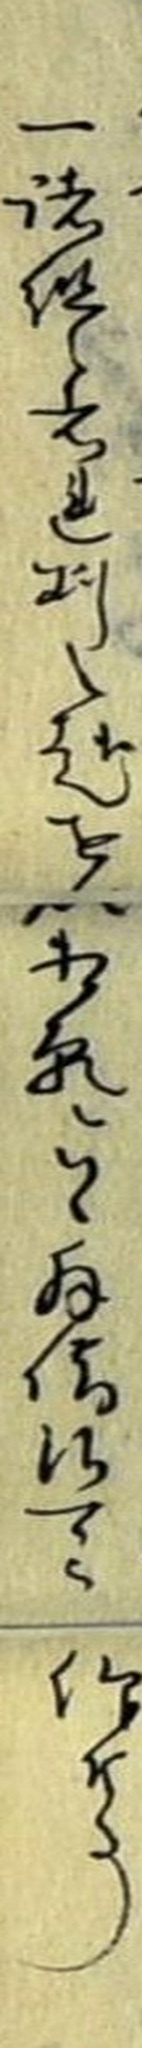一諸組之者連判之趣を以相願候はゝ拝借銀可被仰付事

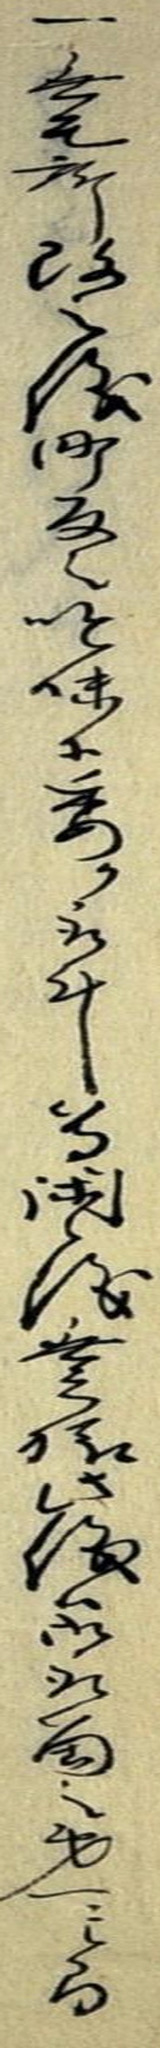一無毛所改之儀町反之吟味等委く取斗等閑儀無之様此儀は御取箇之第一に候間
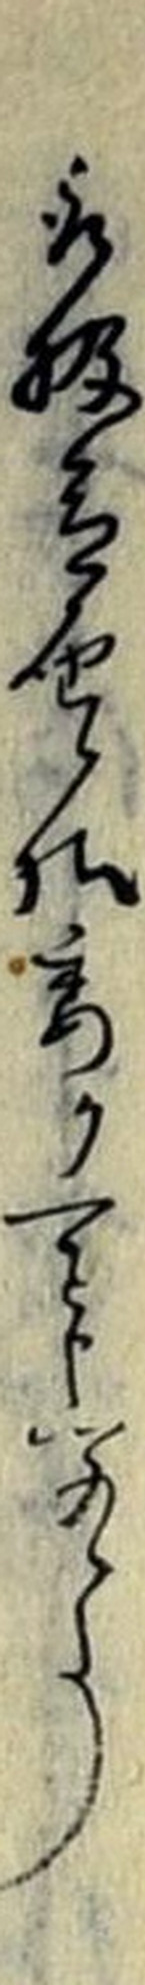取扱参届候様委く可被申聞候事
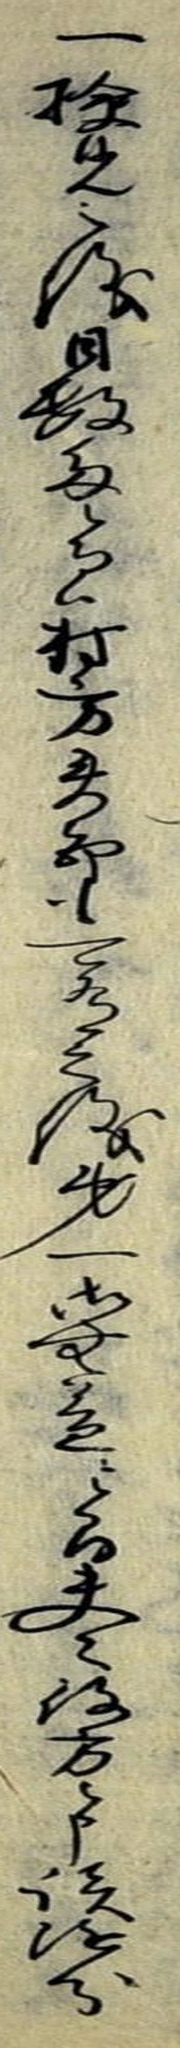一検見之儀日数多候而は村方失却も可有之儀第一御無益に候間夫々役方被申談随分
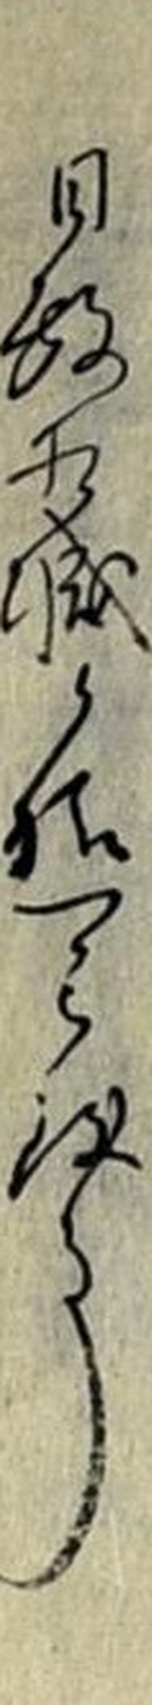日数相減候様可被致事
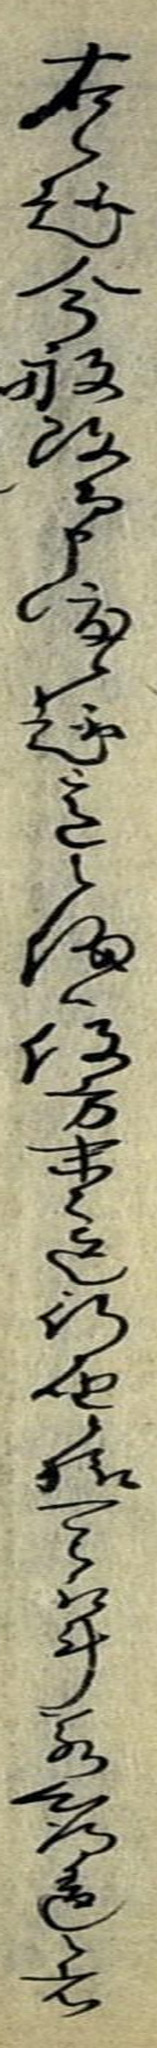右之趣今般改而申渡候趣意之儀は役方末々迄行届候様可被取斗若心得違之者
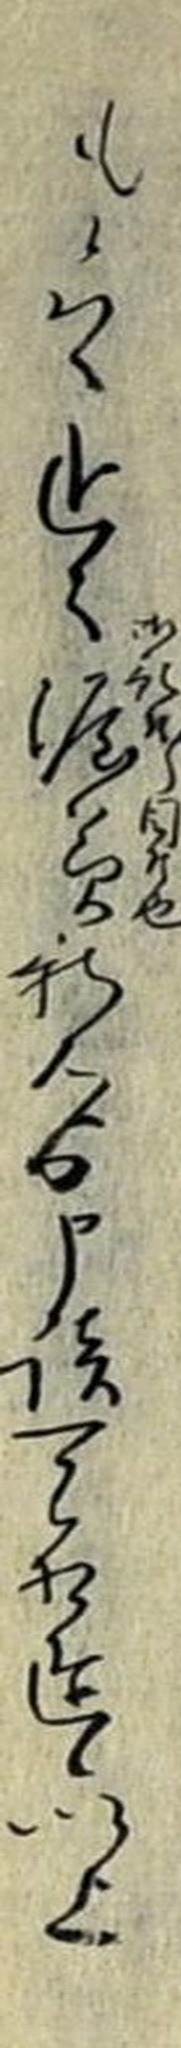も候はゝ追々渥美新右衛門申談可被相達候以上
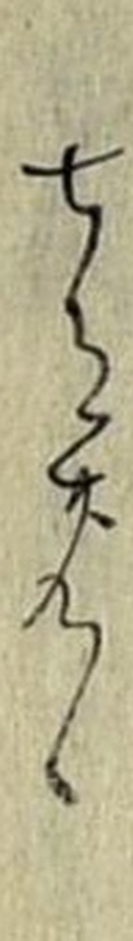七月廿九日
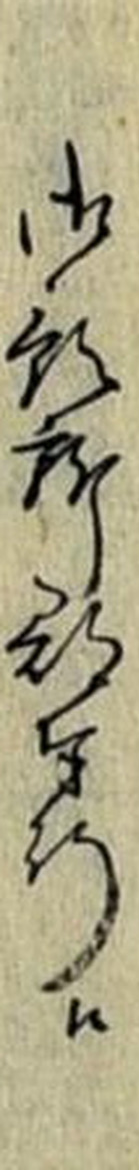御預所郡奉行え
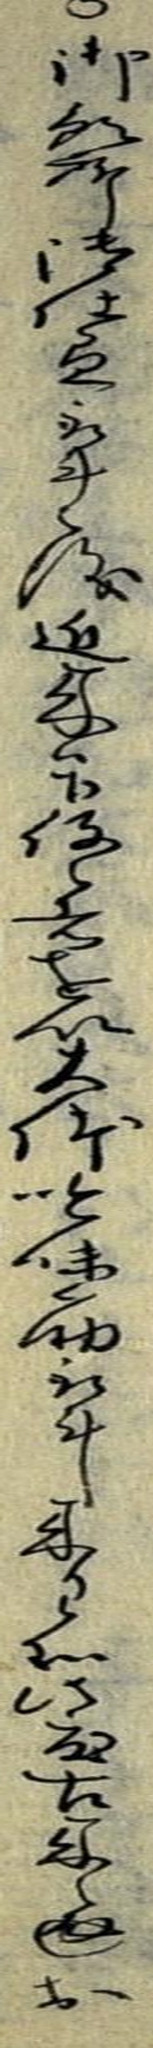〇御預所御仕置取斗之儀近来は下役之者を以大体吟味筋取斗来り候処此度古来之通於
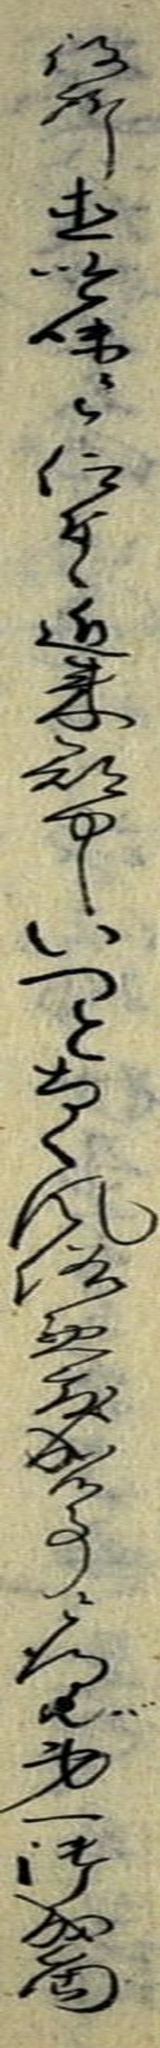役所直吟味に被仰付候近来郡中いつとなく風俗悪敷成候事に候共第一御成箇
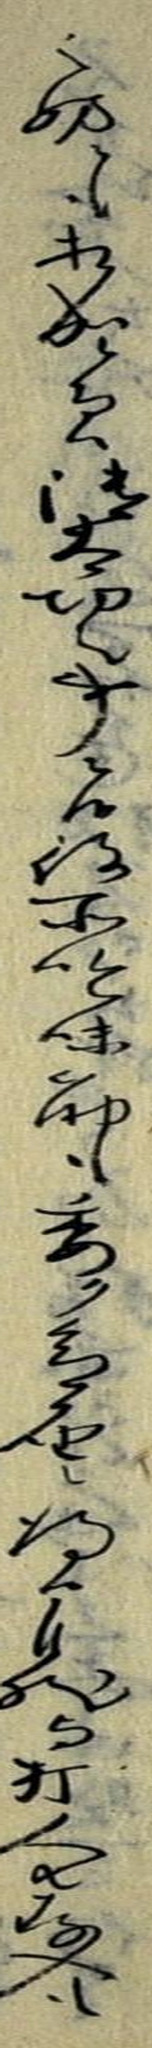之妨にも相成候而は御太切之事に候役所吟味筋も委く参届候得は自然与村人共存入も
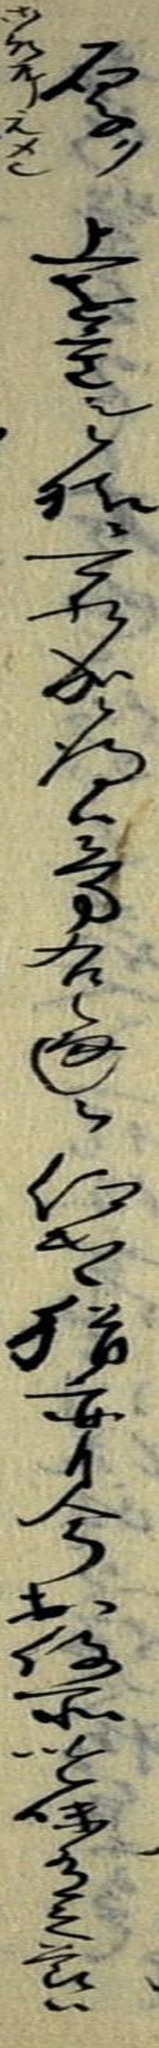厚く上を重し候様に可相成候得は旁右之通被仰出候猶亦自今於役所吟味有之節は
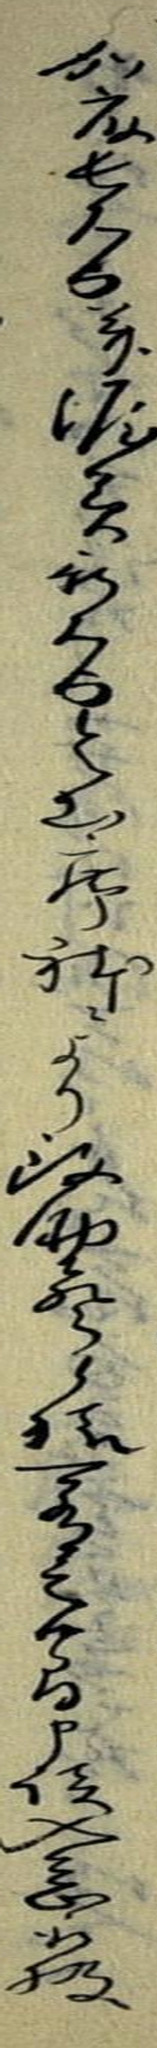加藤長右衛門并渥美新右衛門令出席躰により致助声候様可有之候間申談入念取扱
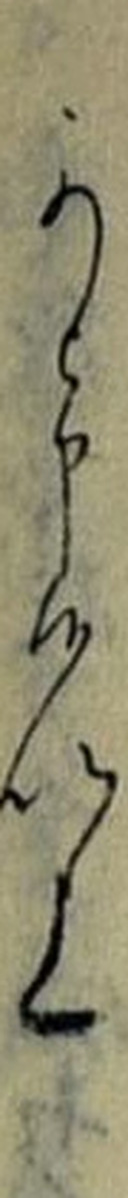可被申候以上
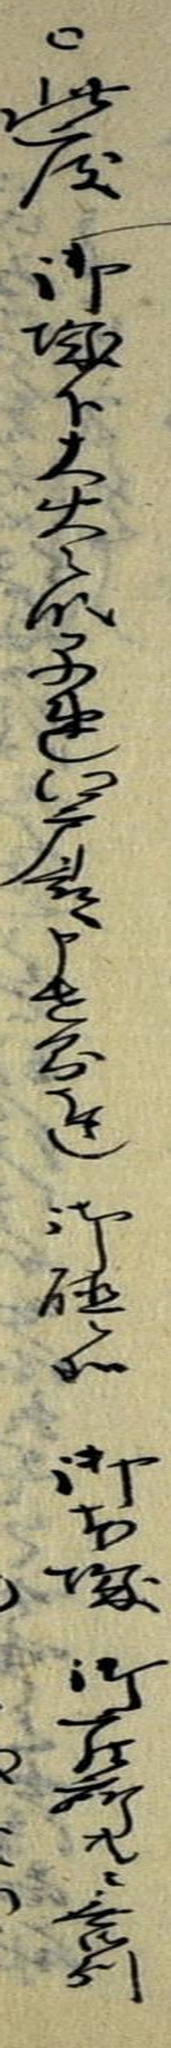〇此度御城下大火之段早速江戸表へ申遣則達御聴候処御本城御在所共に無御別
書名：命令之部 二
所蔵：福井県文書館 Fukui Prefectural Archives
